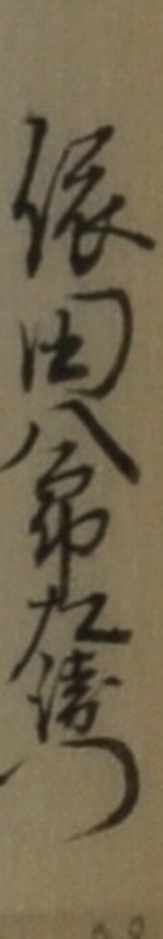依田八郎左衛門
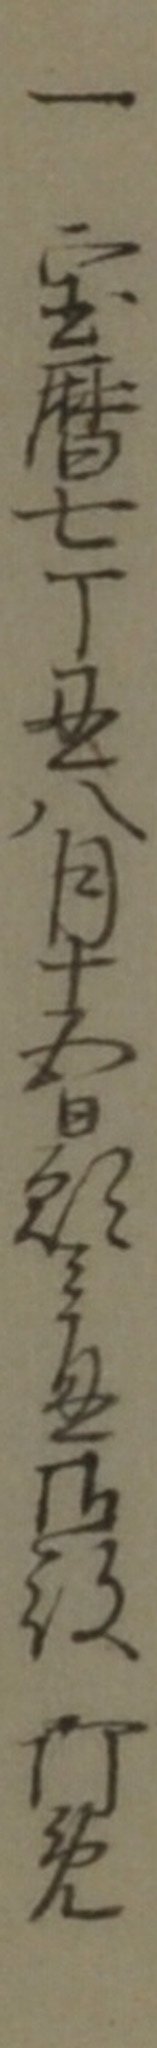一宝暦七丁丑八月十五日願之通御役御免
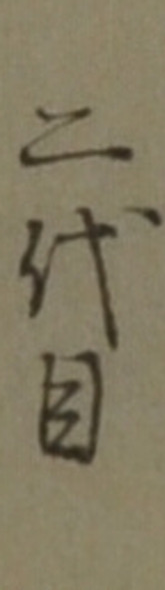二代目
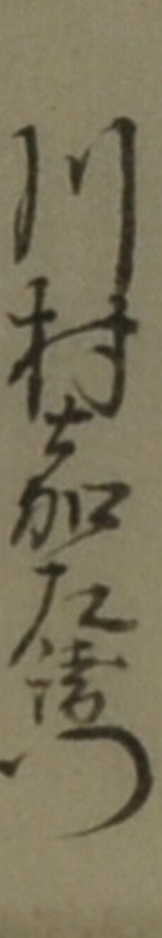川村嘉左衛門
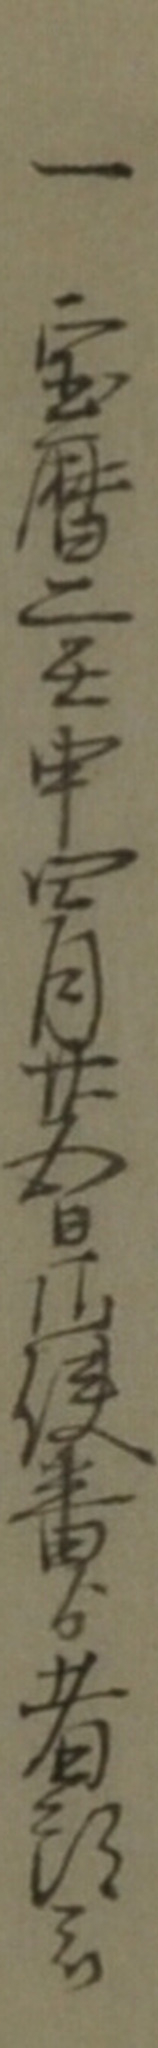一宝暦二壬申四月廿五日御使番ゟ者頭被
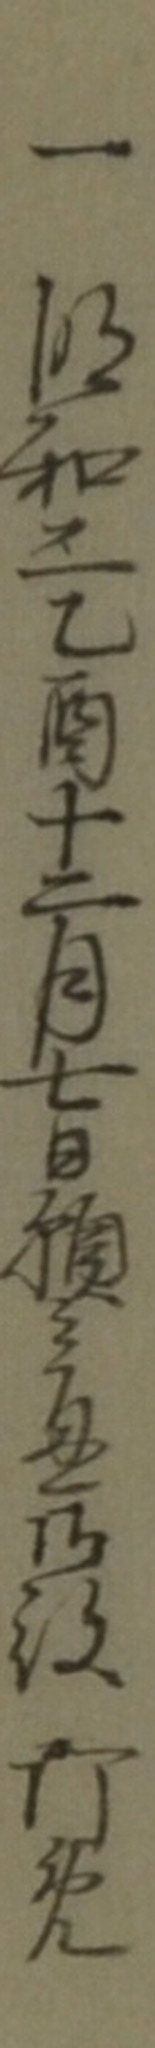一明和二乙酉十二月七日願之通御役御免
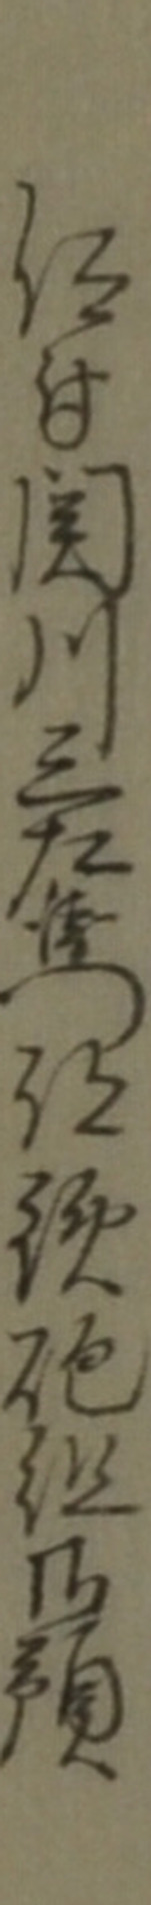仰付関川三左衛門跡鉄砲組御預
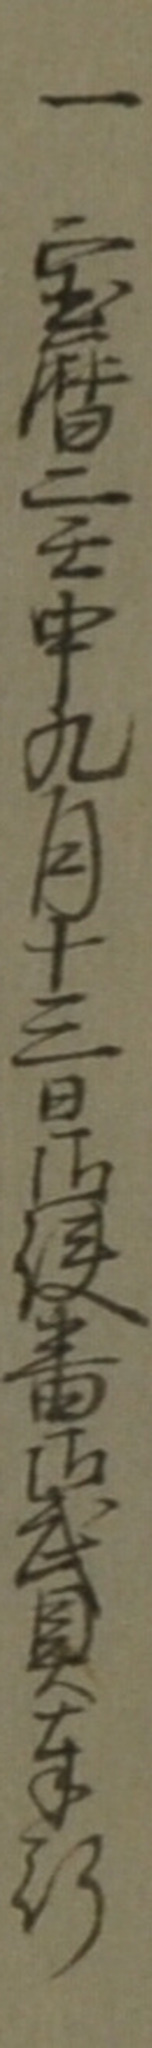一宝暦二壬申九月十三日御使番御武具奉行
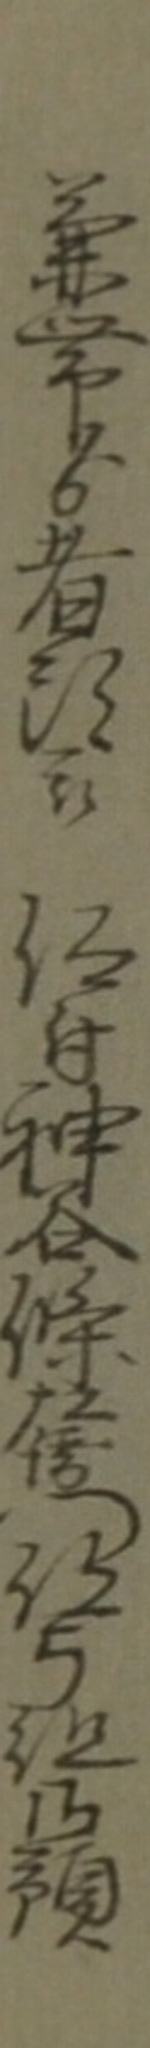兼帯ゟ者頭被仰付神谷條左衛門跡弓組御預
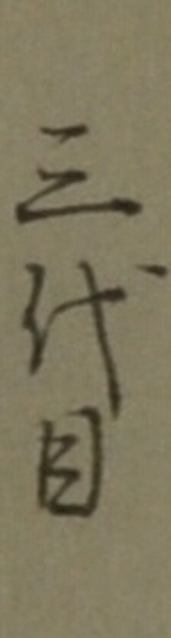三代目
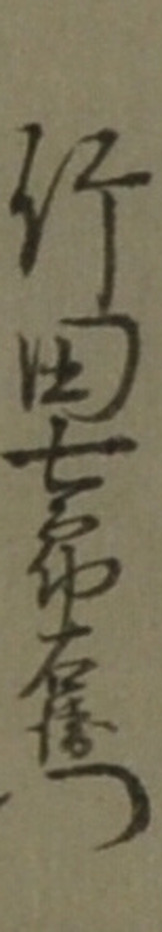竹田七郎右衛門
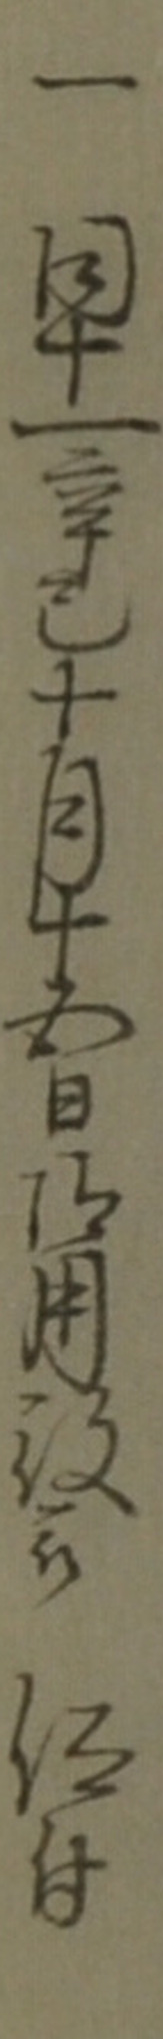一同十一辛巳十月十五日御用役被仰付
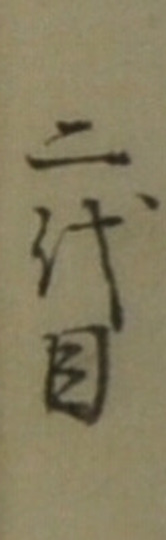二代目

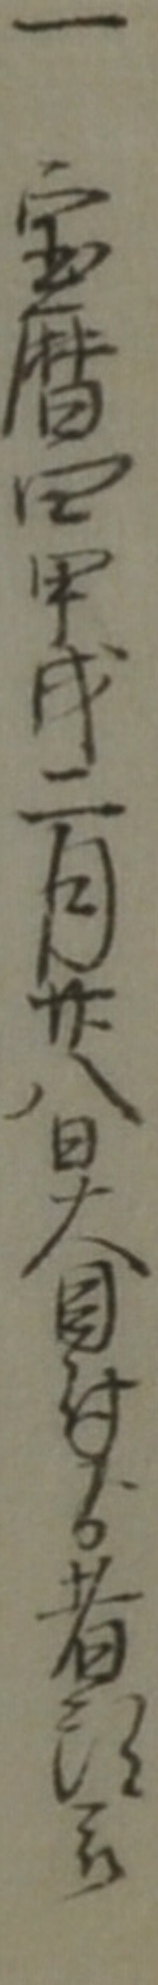一宝暦四甲戌二月廿八日大目付ゟ者頭被
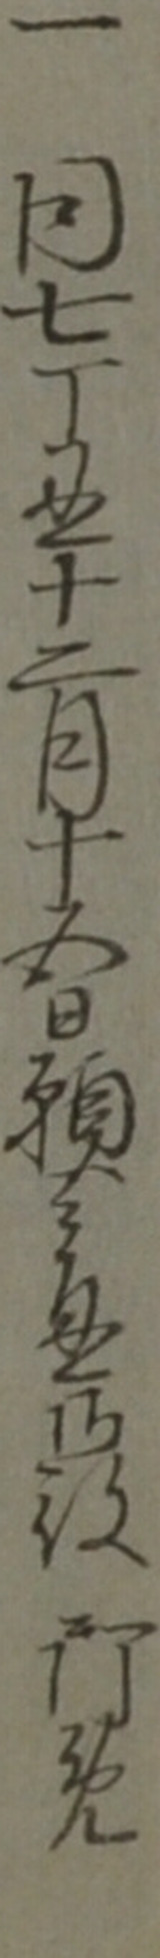一同七丁丑十二月十五日願之通御役御免
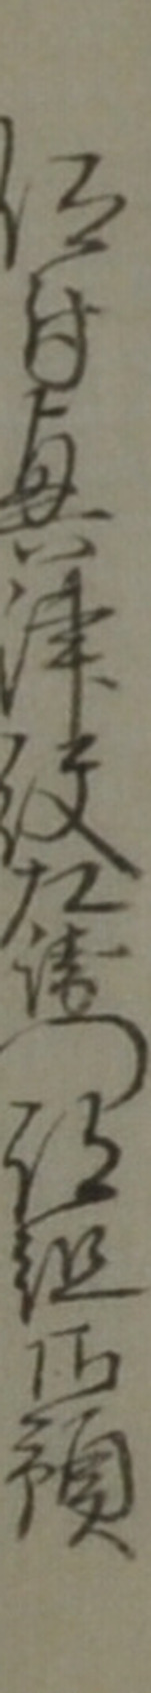仰付奥津紋左衛門跡組御預
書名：諸御役代々録（二）
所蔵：伊那市立高遠町図書館・合同会社AMANE
